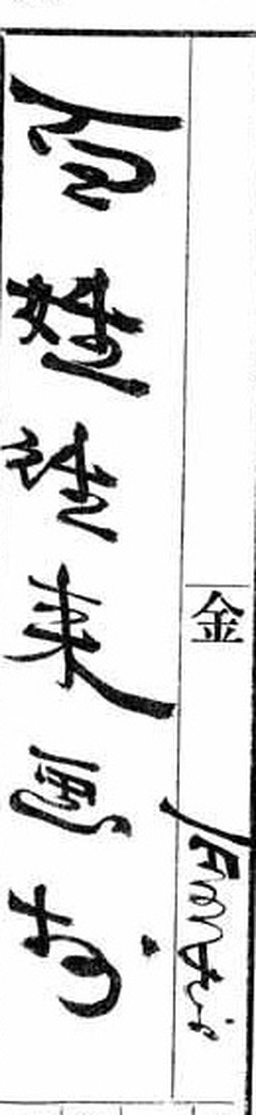百姓往来画抄

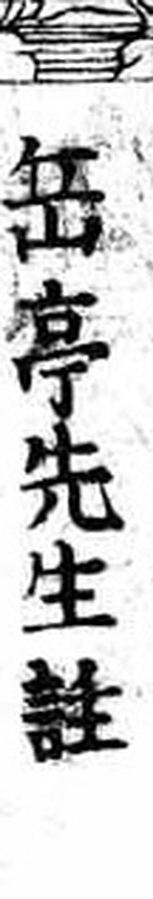岳亭先生註
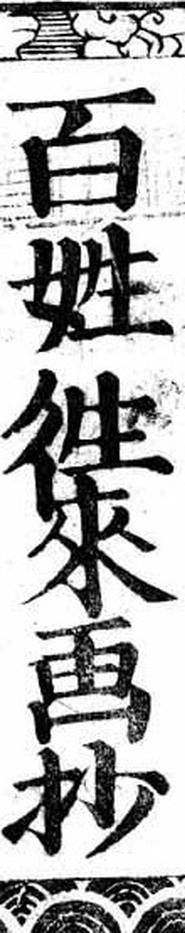百姓往来画抄
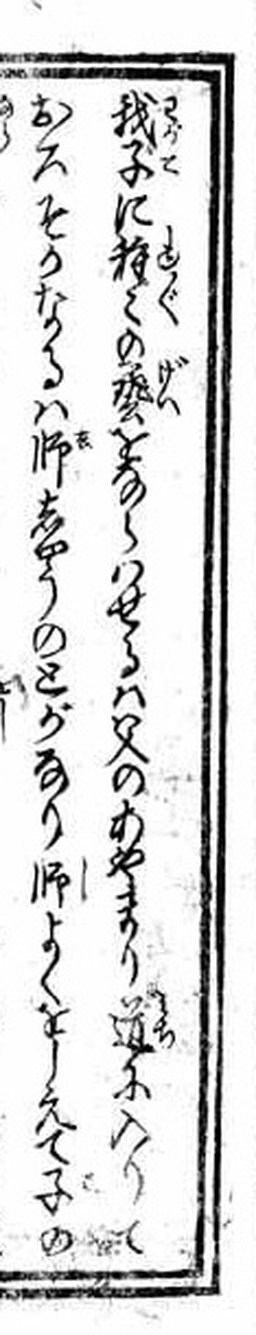我子に種々の芸をならはせるは父のあやまり道に入りて
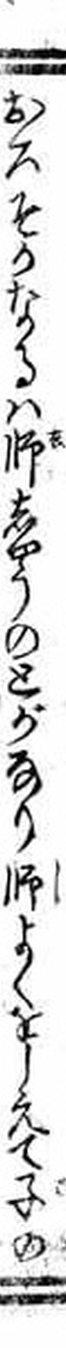おろそかなるは師しやうのとがなり師よくをしえて子の
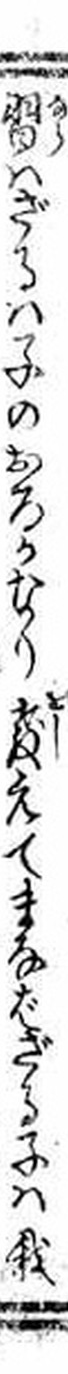習はざるは子のおろかなり教えてまなばざる子は我
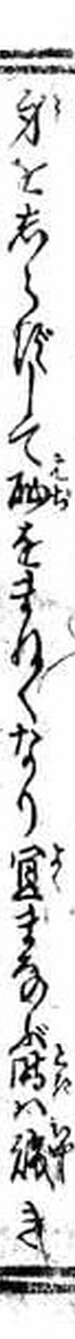身をしらずして恥をまねくなり宜まなぶ時は賤き
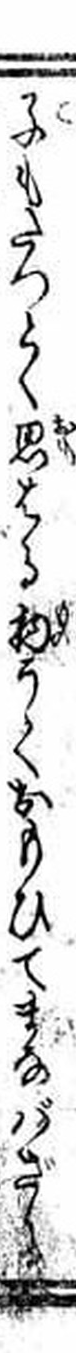子もたつとく思はる物うくおもひてまなばざる
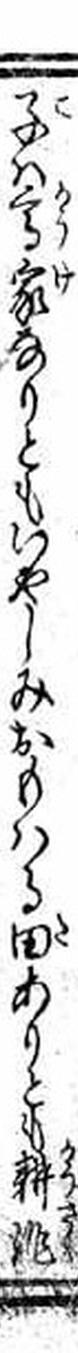子は高家なりともいやしみおもはる田ありとも耕作
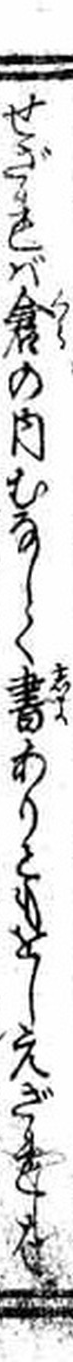せざれば倉の内むなしく書ありともをしえざれば
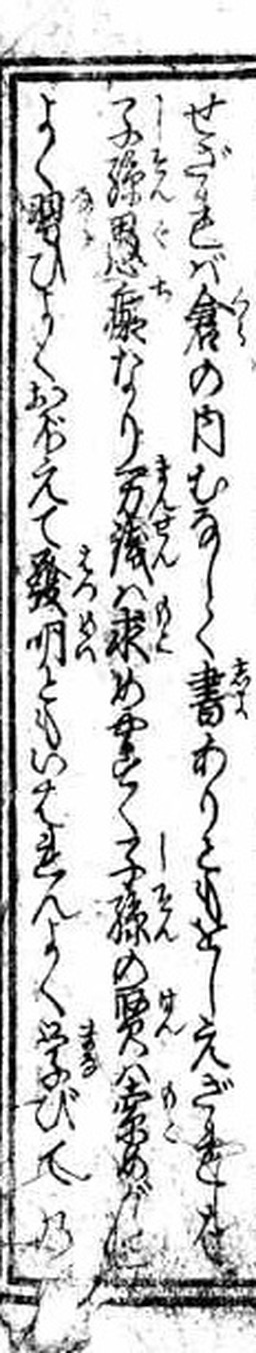子孫愚痴なり万銭は求めやすく子孫の賢は索めがたし
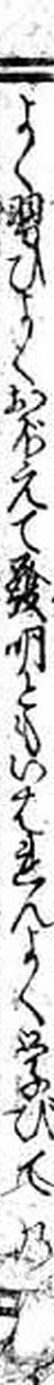よく習ひよくおぼえて発明ともいはれんよく学びての

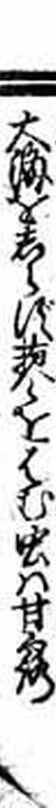大海をしらず蓼をはむ虫は甘露
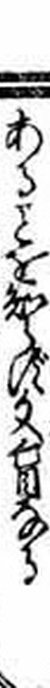あることを知らず文盲なる
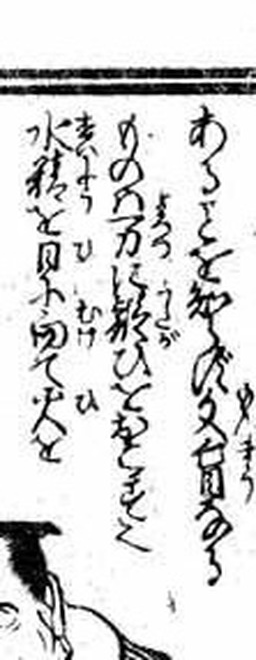ものは万に疑ひをおこす也
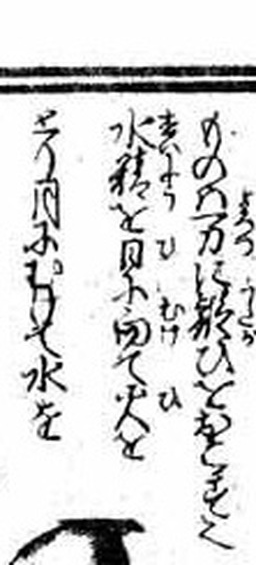水精を日に向て火を
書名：百姓往来画抄
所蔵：東京学芸大学教育コンテンツアーカイブ
